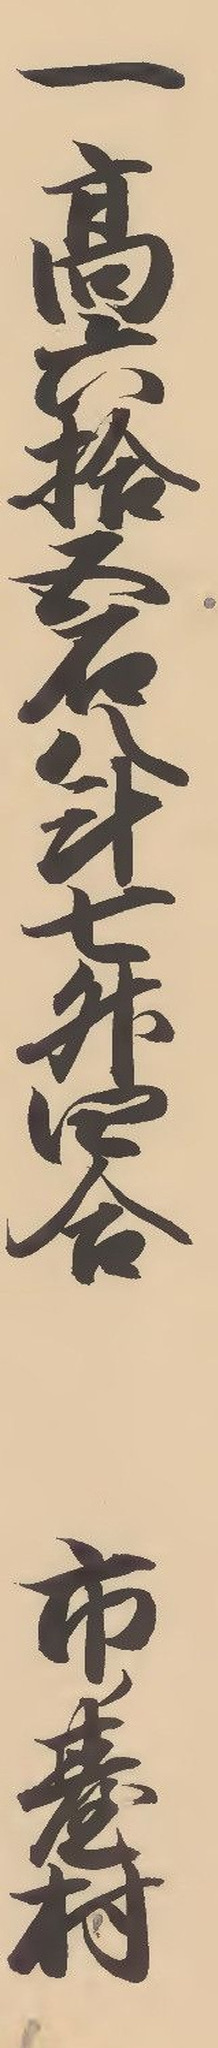一高六拾五石八斗七升四合市ノ台村
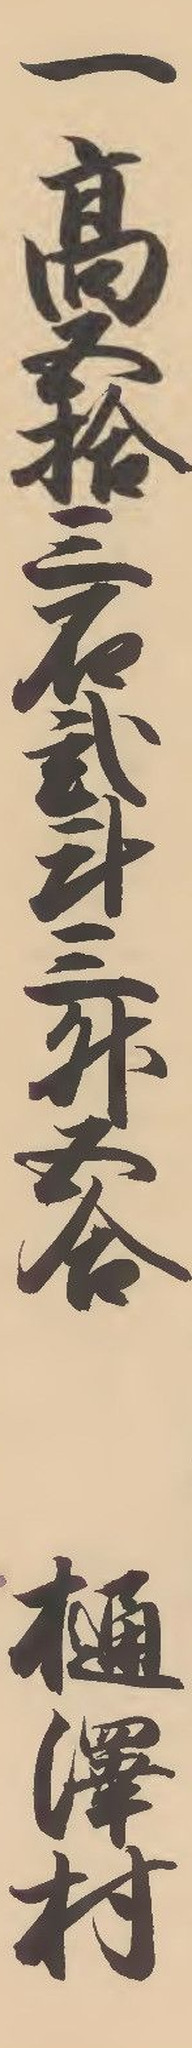一高五拾三石弐斗三升五合樋沢村

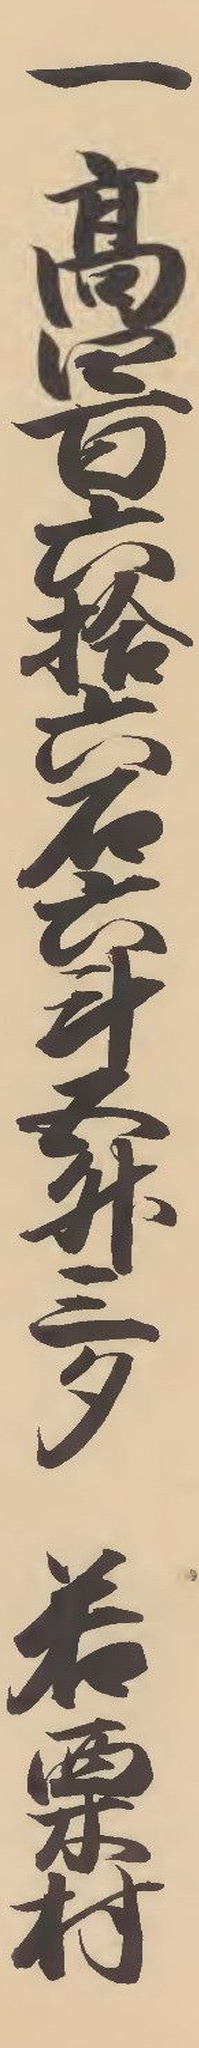一高四百六拾六石六斗五升三勺若栗村
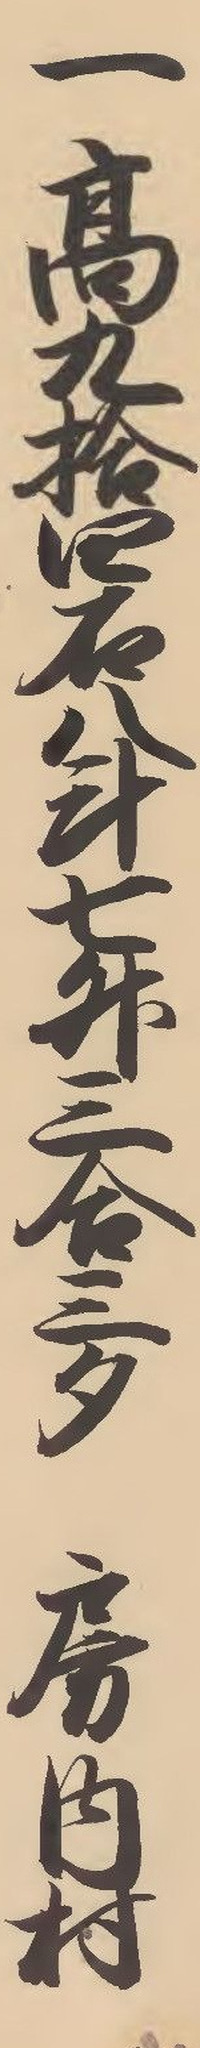一高九拾四石八斗七升三合三勺房内村
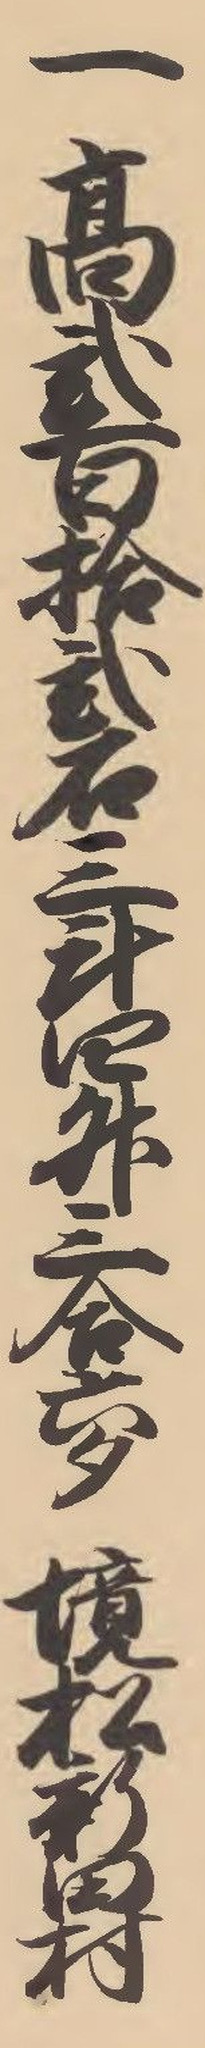一高弐百拾弐石三斗四升三合六勺境松新田村
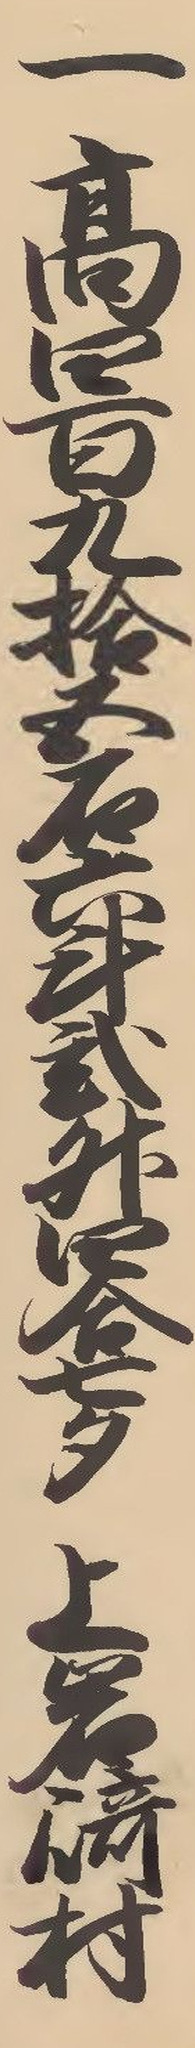一高四百九拾五石六斗弐升四合七勺上岩崎村
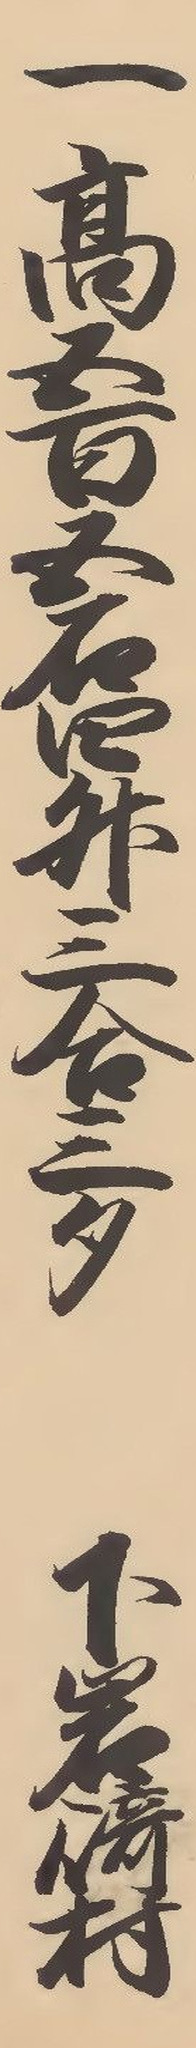一高五百五石四升三合三勺下岩崎村
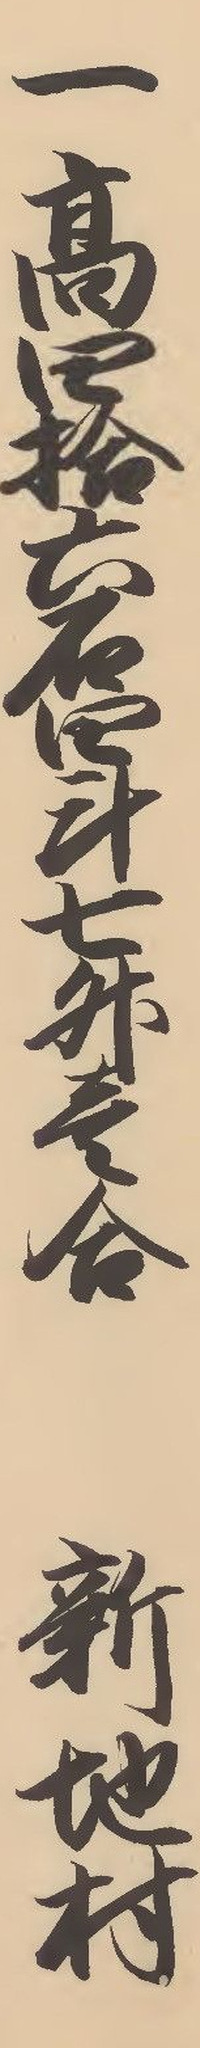一高四拾六石四斗七升壱合新地村
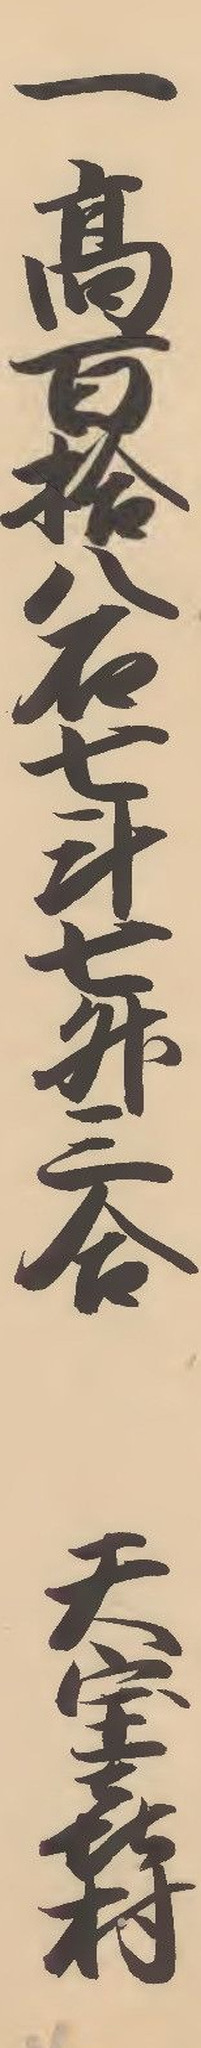一高百拾八石七斗七升三合天宝喜村
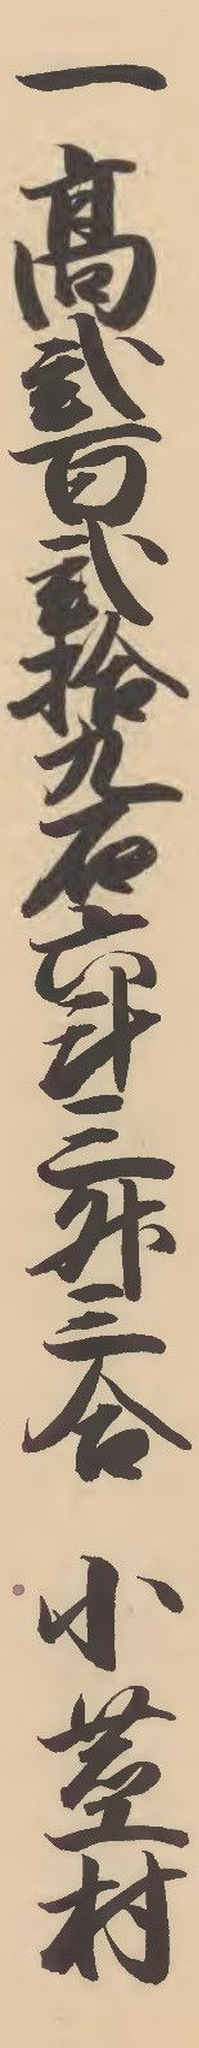一高弐百弐拾九石六斗三升三合小茎村

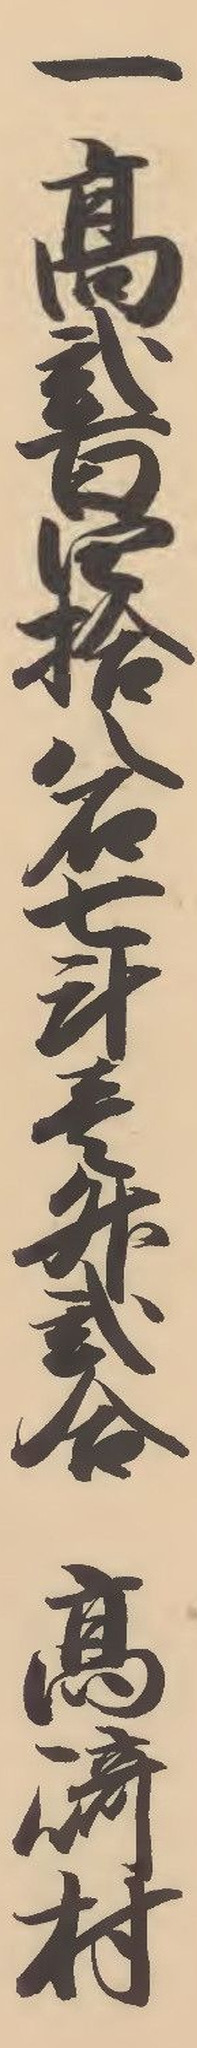一高弐百四拾八石七斗壱升弐合高崎村
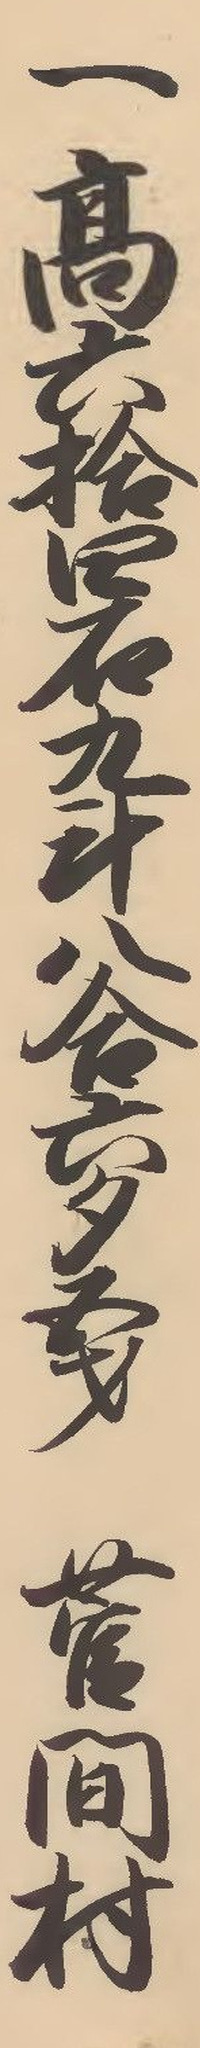一高六拾四石九斗八合六勺五才菅間村
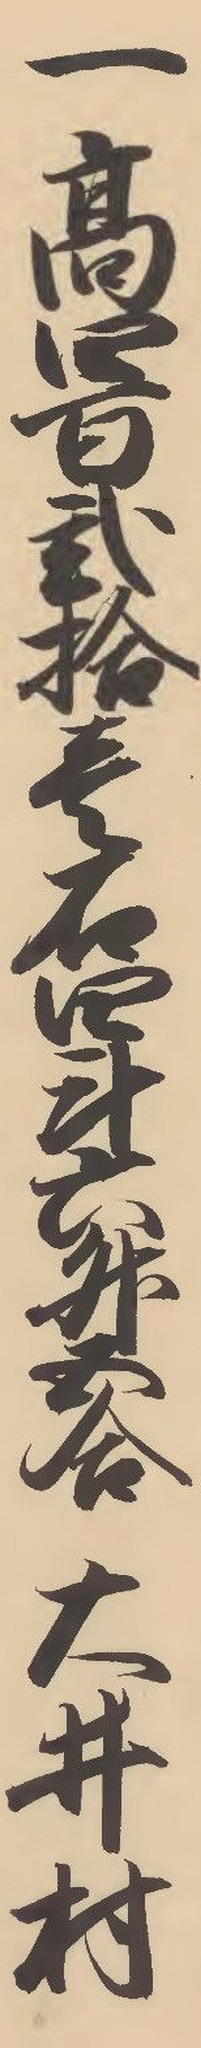一高四百弐拾壱石四斗六升五合大井村
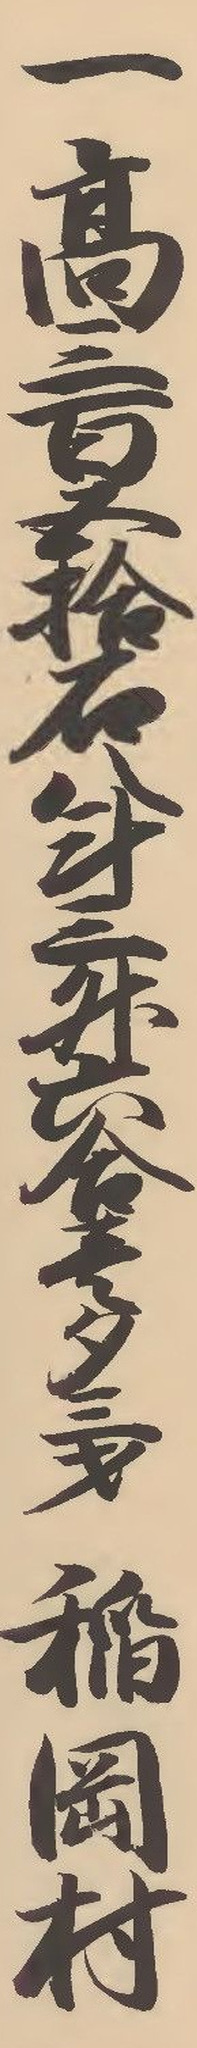一高三百五拾石八斗三升六合壱勺三才稲岡村
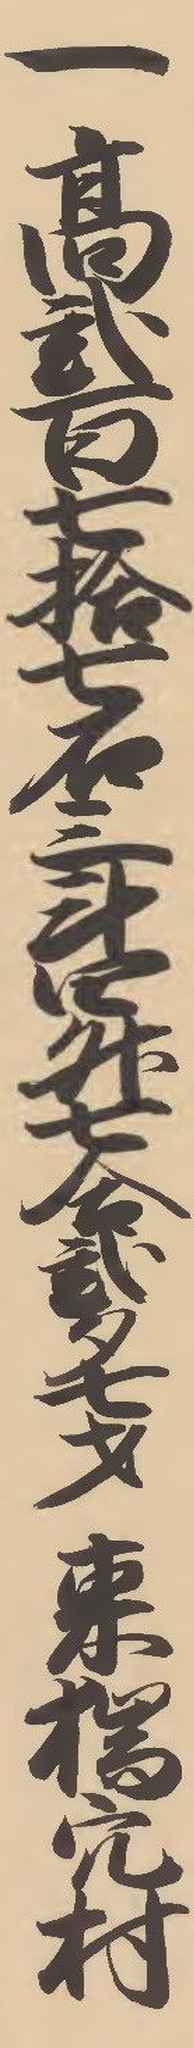一高弐百七拾七石三斗四升七合弐勺七才東猯穴村
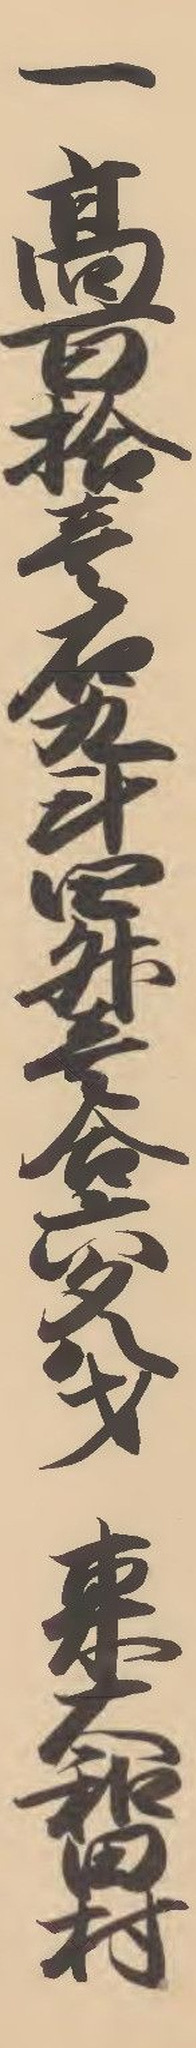一高百拾壱石九斗四升壱合六勺八才東大和田村
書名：常陸国郷帳
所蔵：国立公文書館 National Archives of Japan
